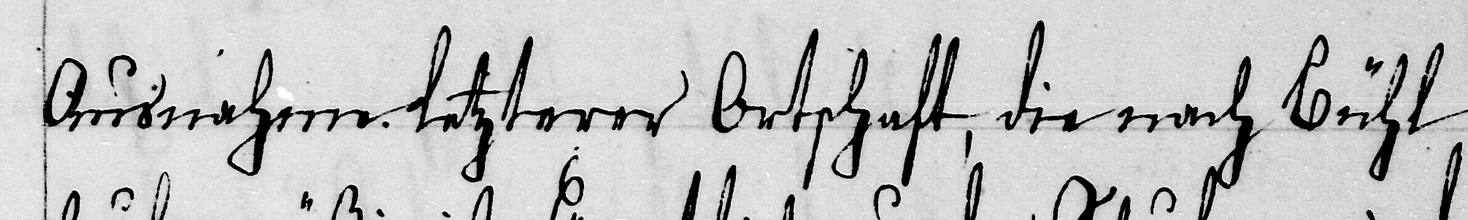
Ausnahme letzterer Ortschaft, die nach Bühl
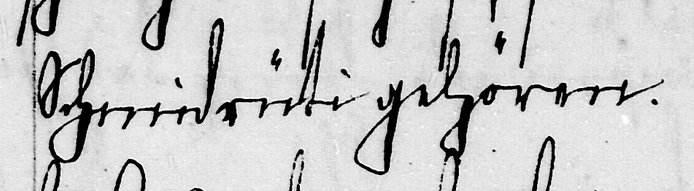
Schmidrüti gehören.
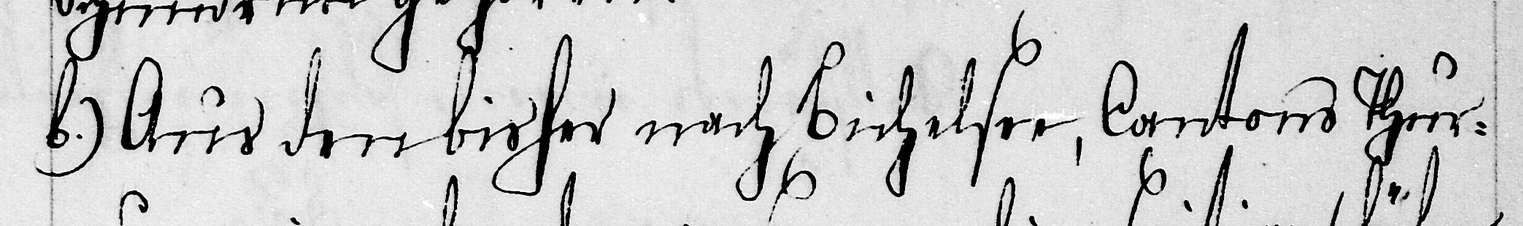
b.) Aus den bisher nach Bichelsee, Cantons Thur¬
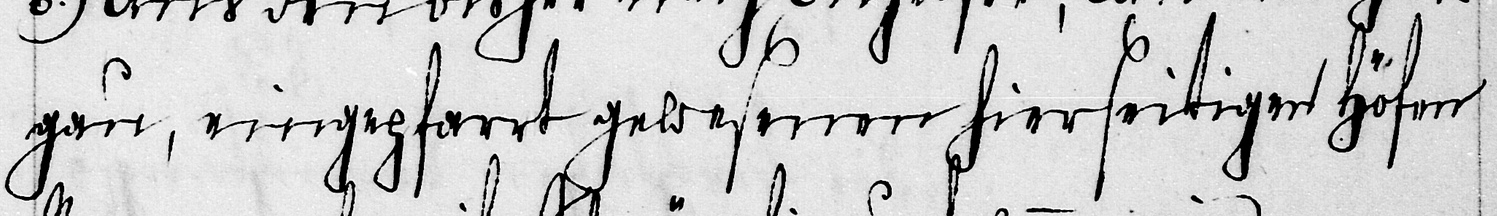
gau, eingepfarrt gewesenen hierseitigen Höfen
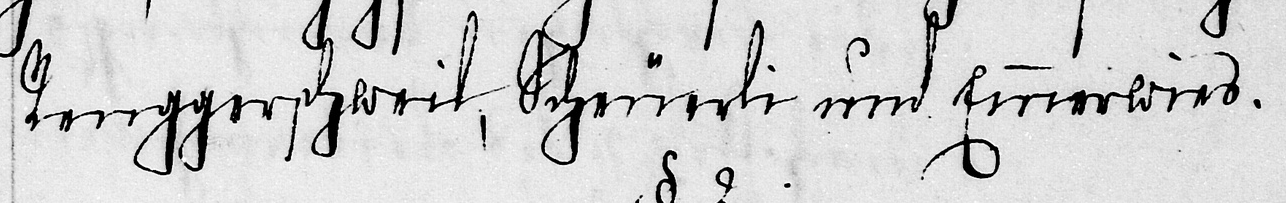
Renggerschweil, Scheuerli und Emmerwies.
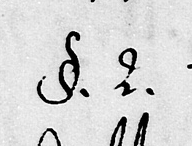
§. 2.
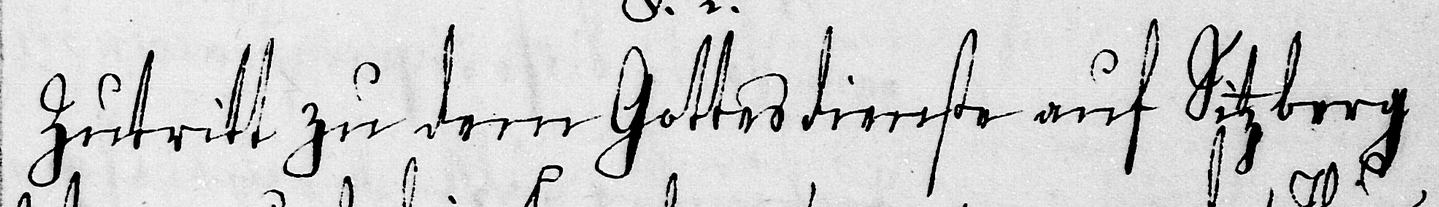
Zutritt zu dem Gottesdienste auf Sitzberg
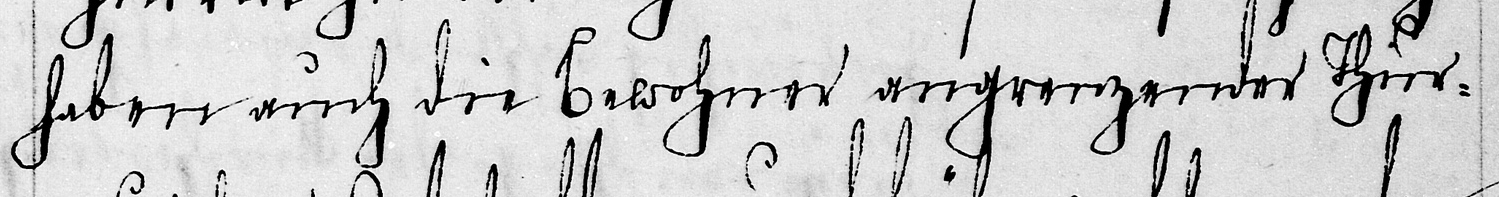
haben auch die Bewohner angrenzender Thur¬
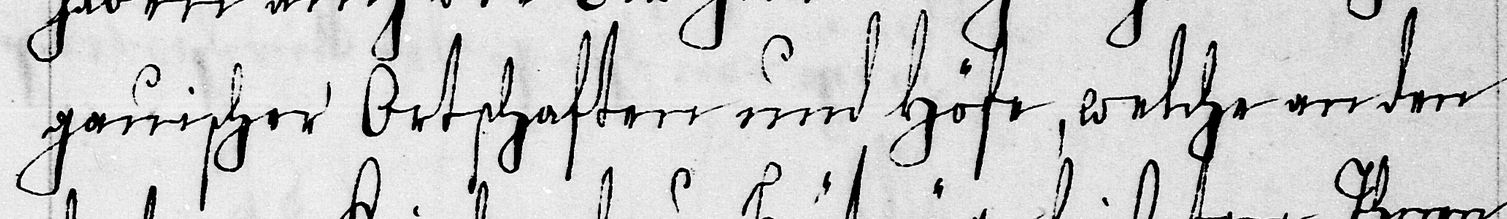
gauischer Ortschaften und Höfe, welche an den
